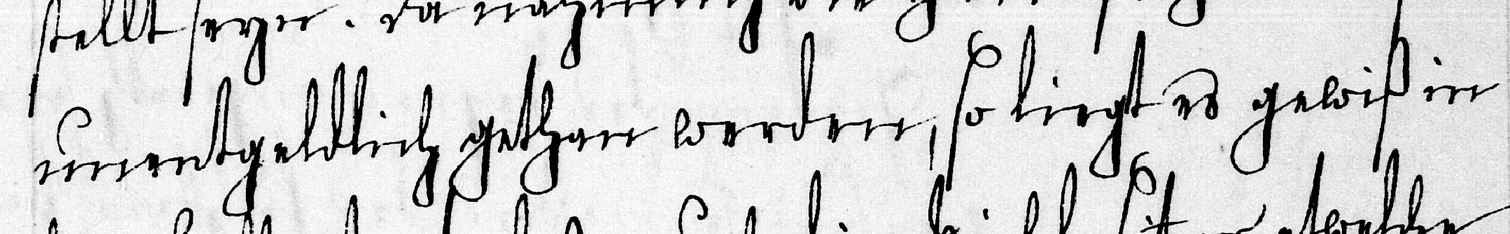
unentgeldlich gethan werden, so liegt es gewiß in
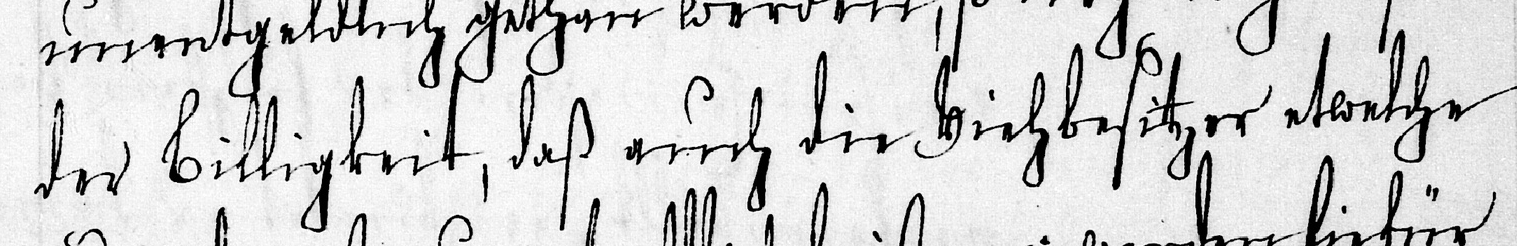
der Billigkeit, daß auch die Viehbesitzer etwelche
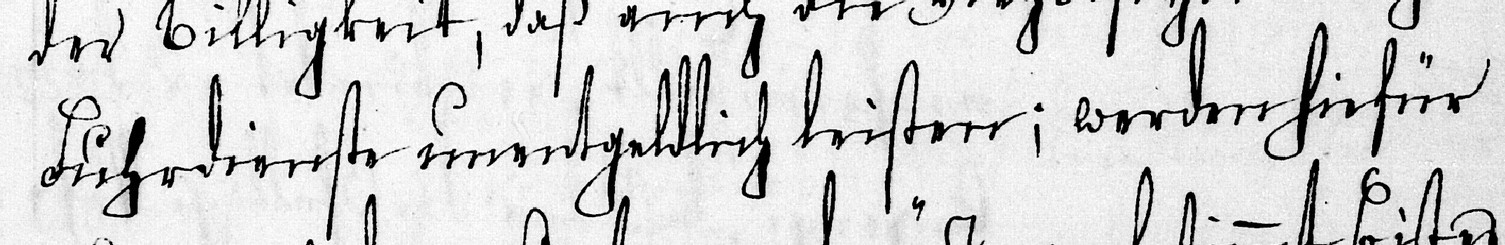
Fuhrdienste unentgeldlich leisten; werden hiefür
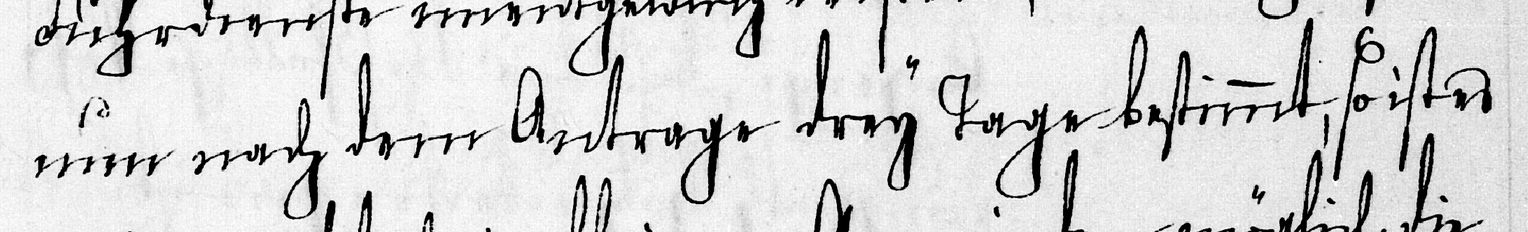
nun nach dem Antrage drey Tage bestimmt, so ist es
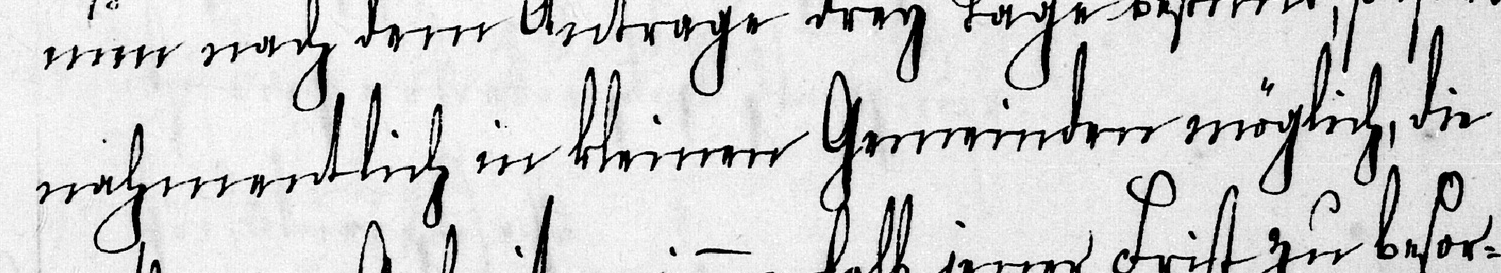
nahmentlich in kleinen Gemeinden möglich, die
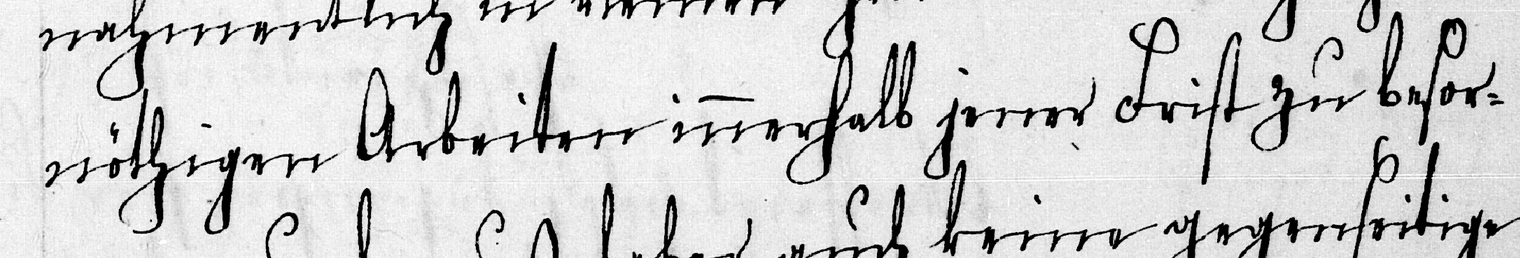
nöthigen Arbeiten innerhalb jener Frist zu besor¬
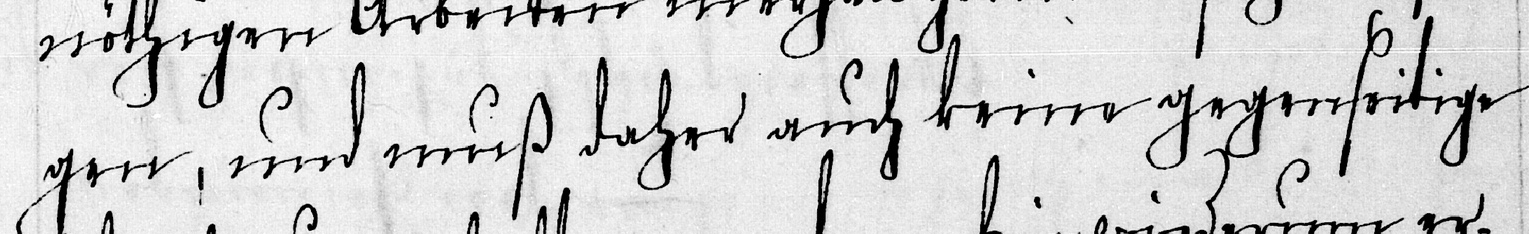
gen, und muß daher auch keine gegenseitige
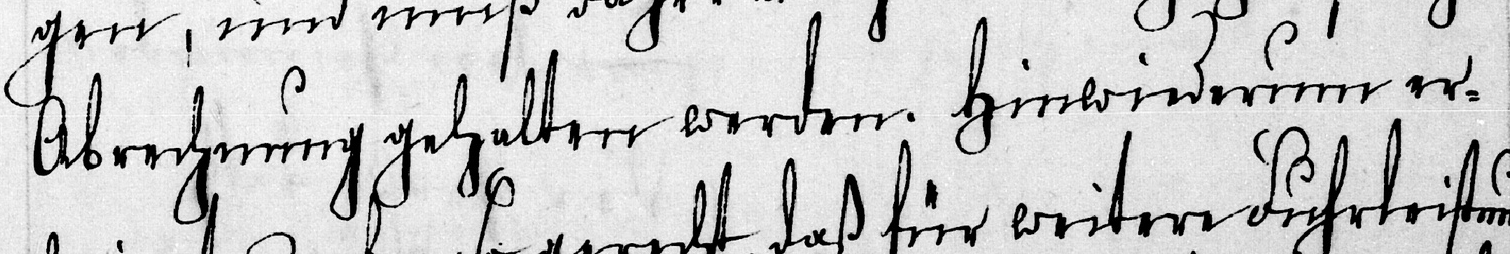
Abrechnung gehalten werden. Hinwiederum er¬
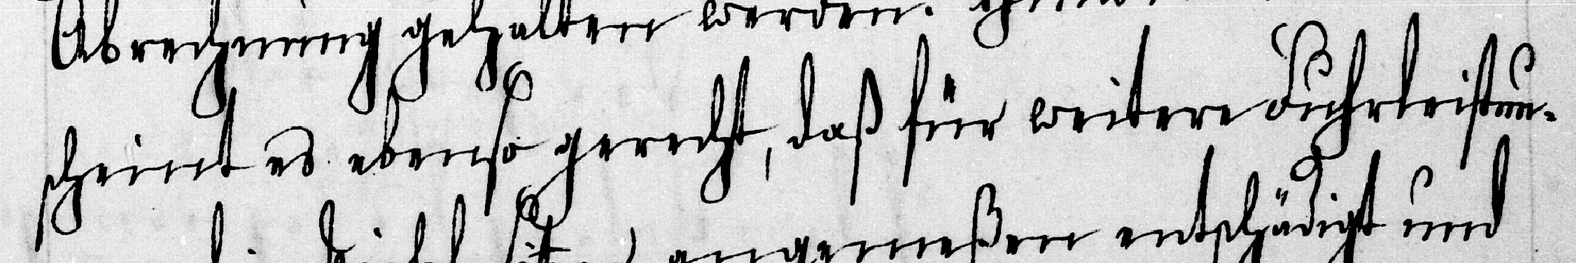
scheint es ebenso gerecht, daß für weitere Fuhrleistun¬
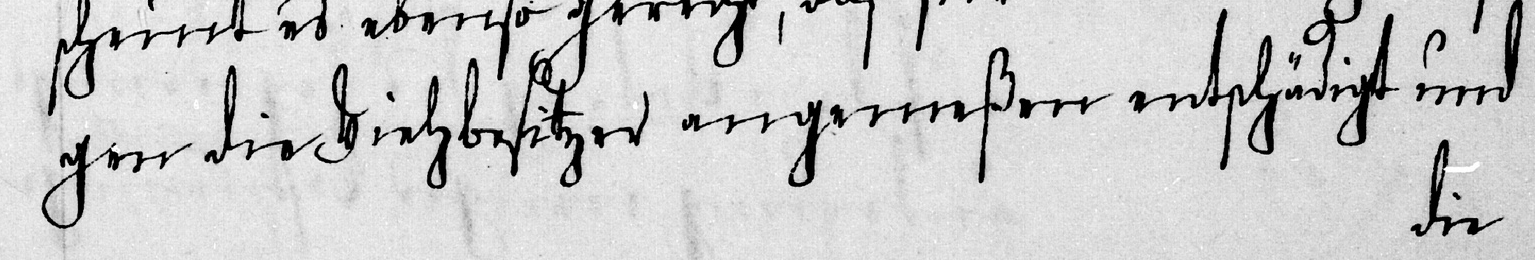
gen die Viehbesitzer angemeßen entschädigt und
